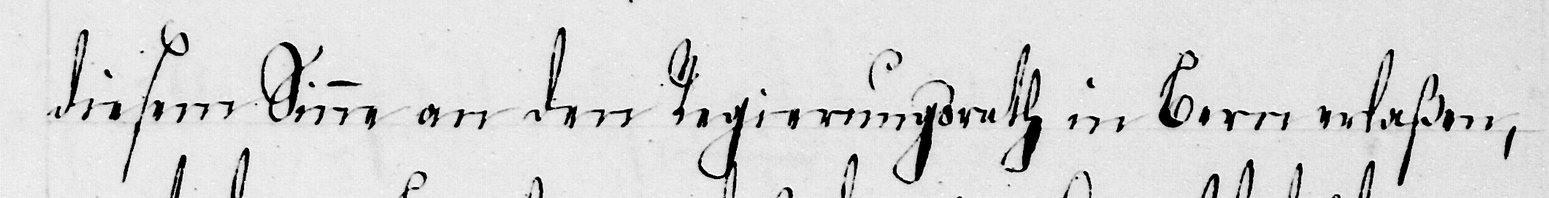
diesem Sinne an den Regierungsrath in Bern erlaßen,
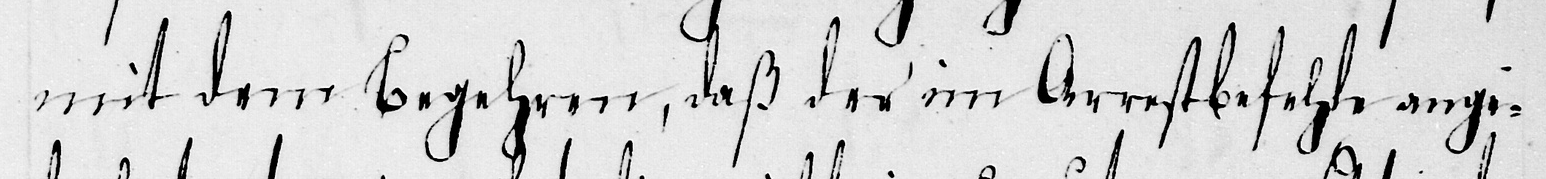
mit dem Begehren, daß der im Arrestbefehle ange¬
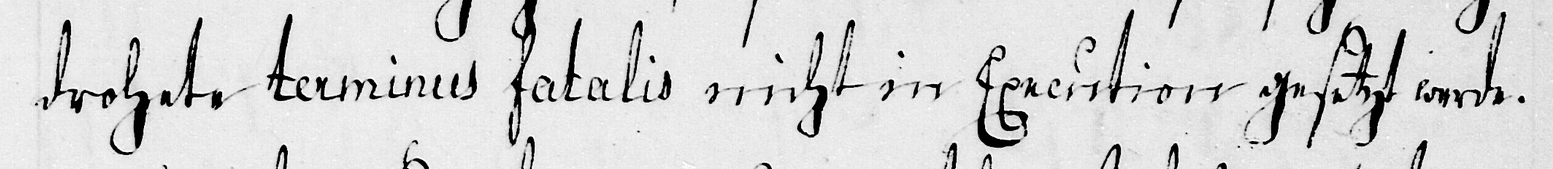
drohete terminus fatalis nicht in Execution gesetzt werde.
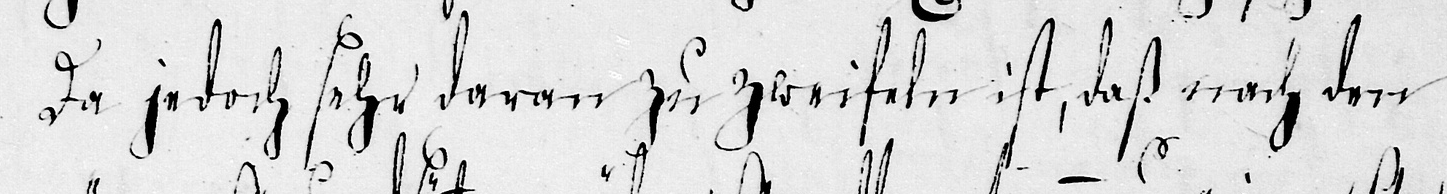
Da jedoch sehr daran zu zweifeln ist, daß nach den
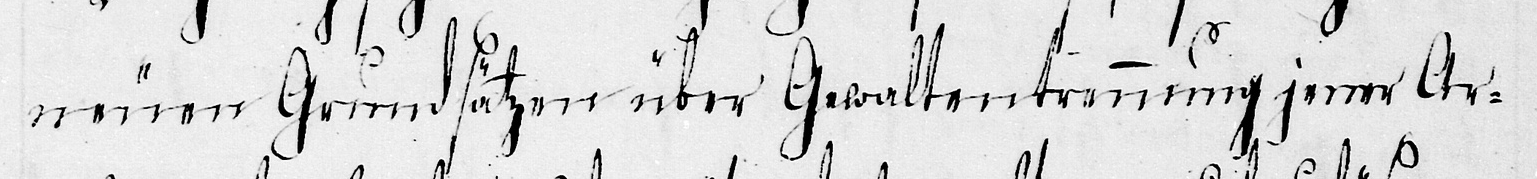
neuen Grundsätzen über Gewaltentrennung jener Ar¬
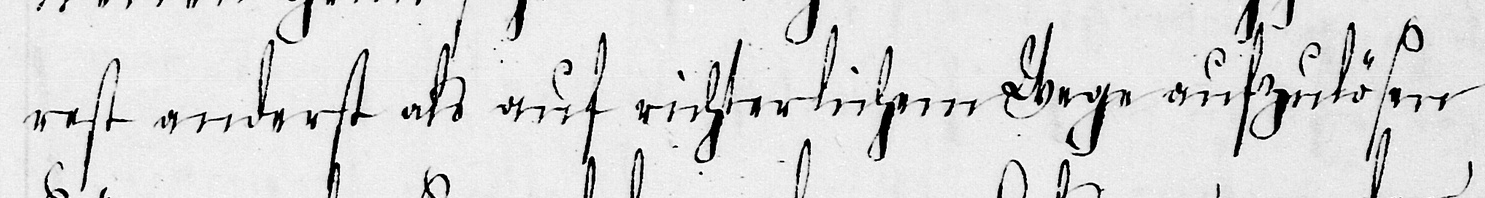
rest anderst als auf richterlichem Wege aufzulösen
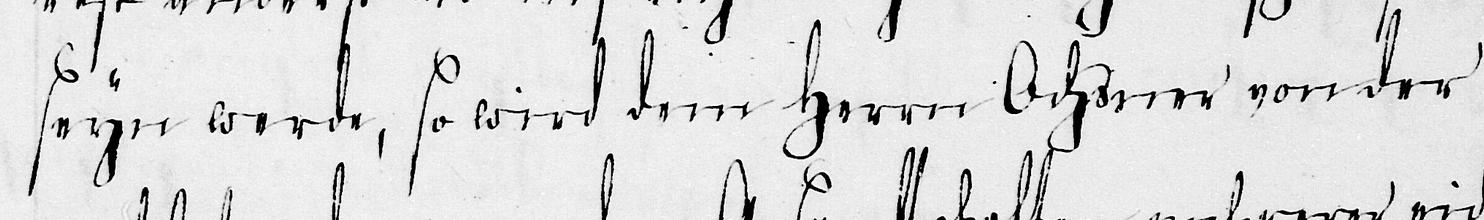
seyn werde, so wird dem Herrn Ochsner von der
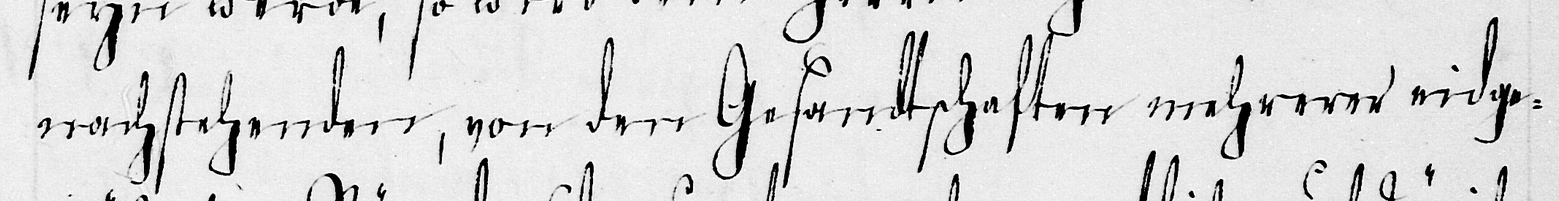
nachstehenden, von den Gesandtschaften mehrerer eidge¬
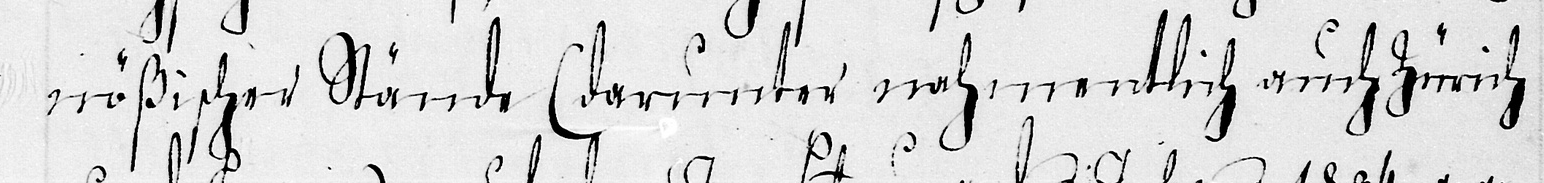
nößischer Stände (darunter nahmentlich auch Zürich
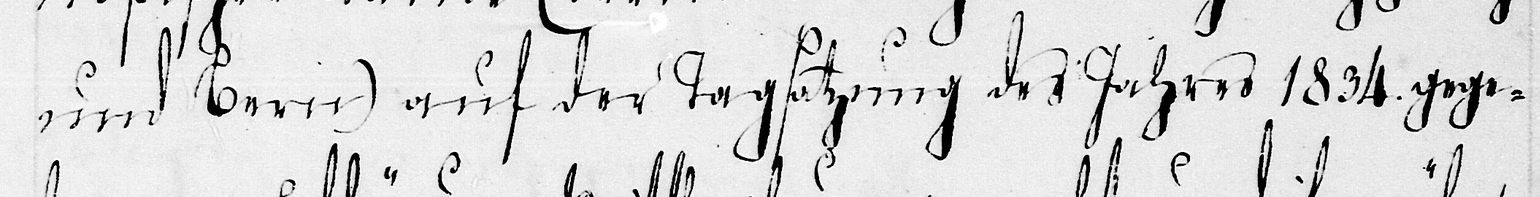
und Bern) auf der Tagsatzung des Jahres 1834. gege¬
